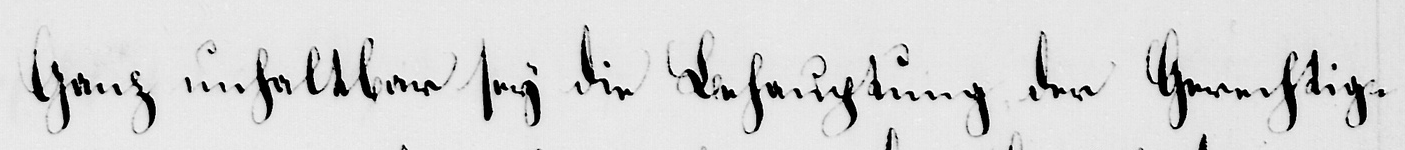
Ganz unhaltbar sey die Behauptung der Gerechtig¬
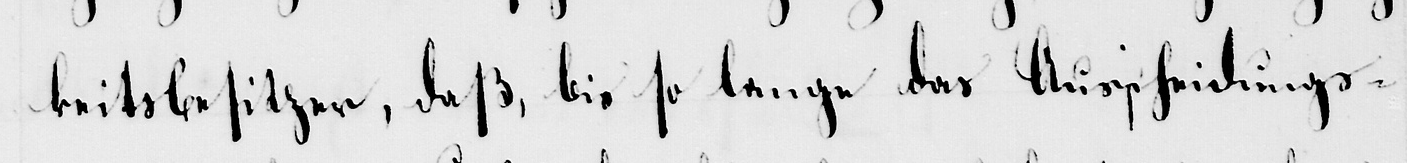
keitsbesitzer, daß bis so lange das Ausscheidungs¬
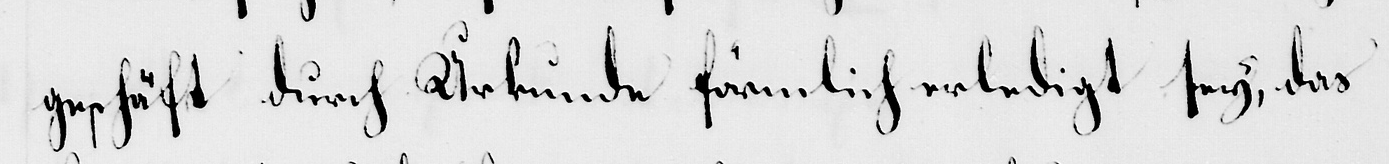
geschäft durch Urkunde förmlich erledigt sey, das
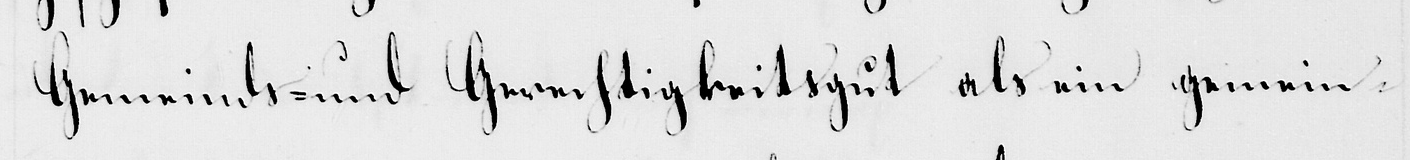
Gemeinds- und Gerechtigkeitsgut als ein gemein¬
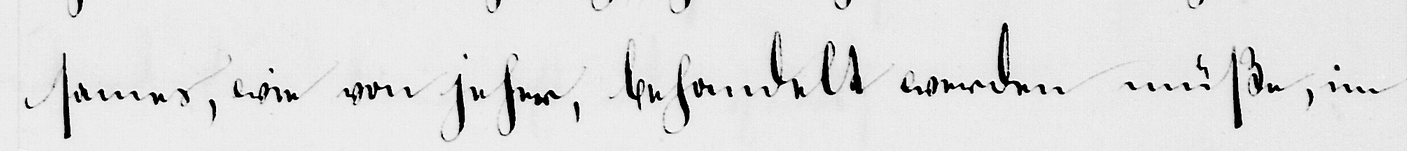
sames, wie von jeher, behandelt werden müße, im
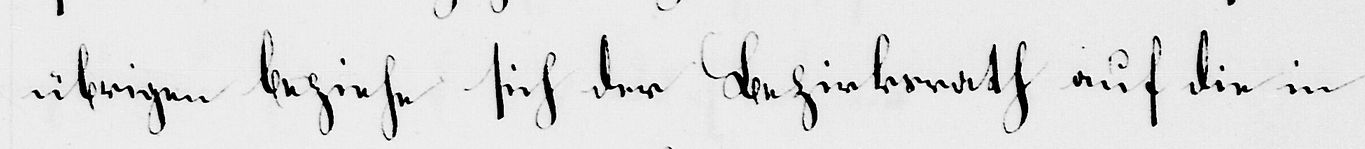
übrigen beziehe sich der Bezirksrath auf die in
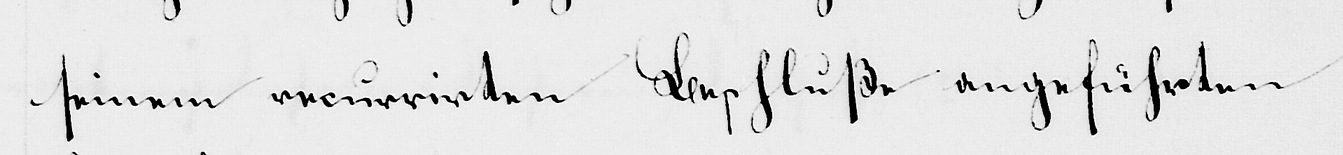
seinem recurrirten Beschluße angeführten
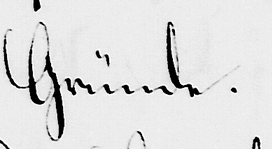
Gründe.
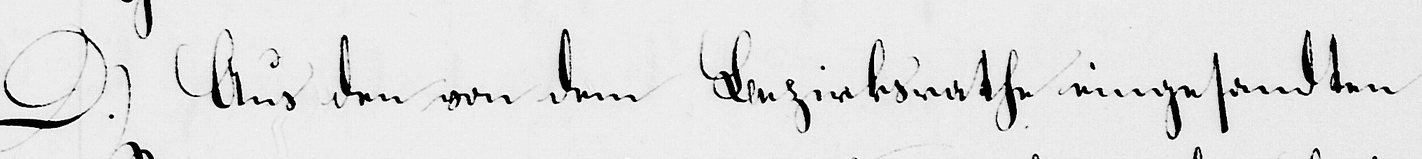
D.) Aus den von dem Bezirksrathe eingesandten
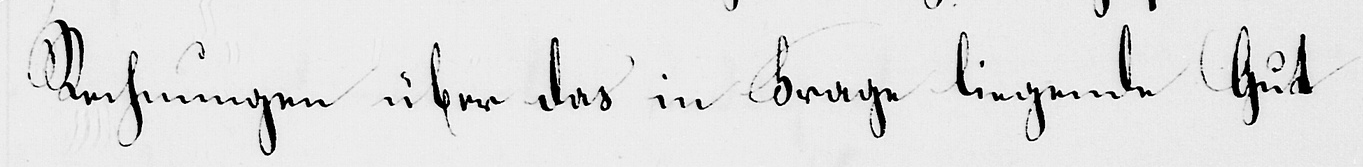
Rechnungen über das in Frage liegende Gut
